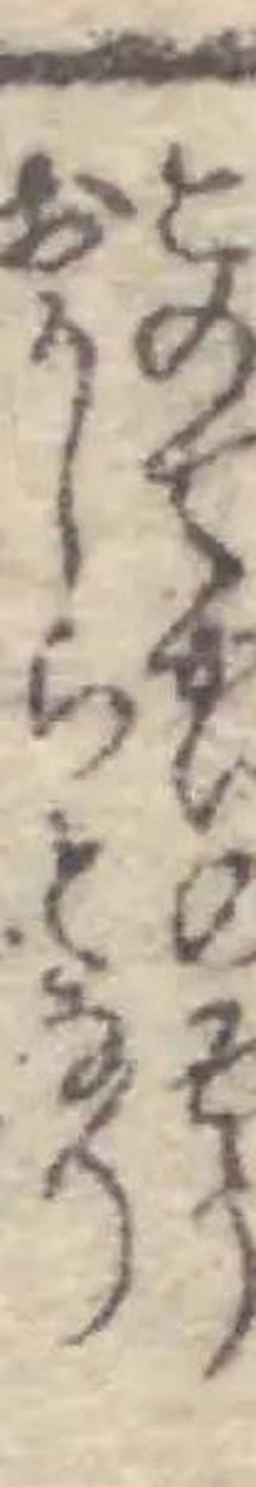おかしらとなり
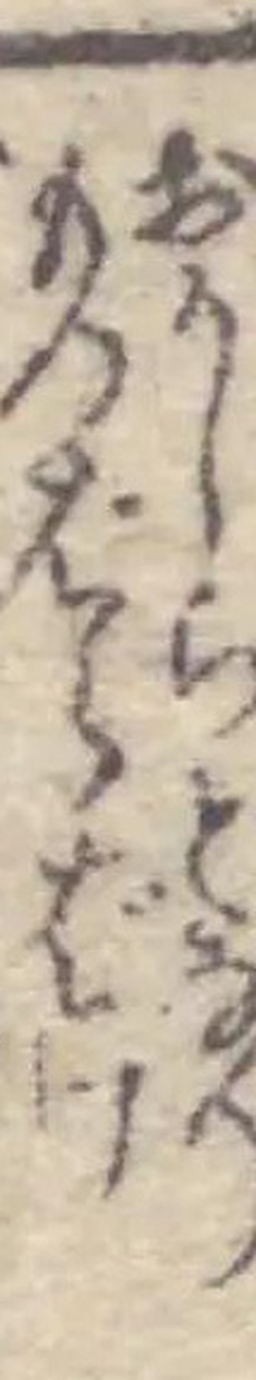もつぱらばけ
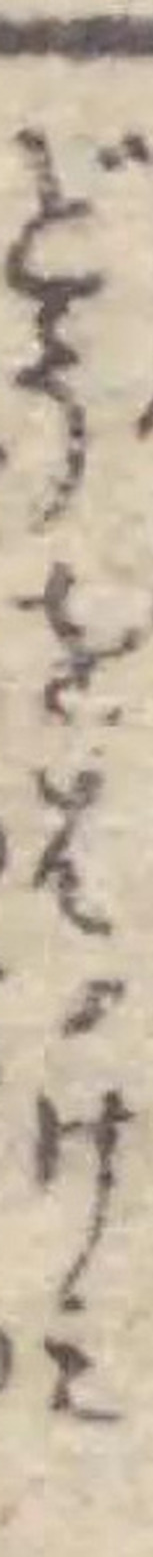どうをはけみ
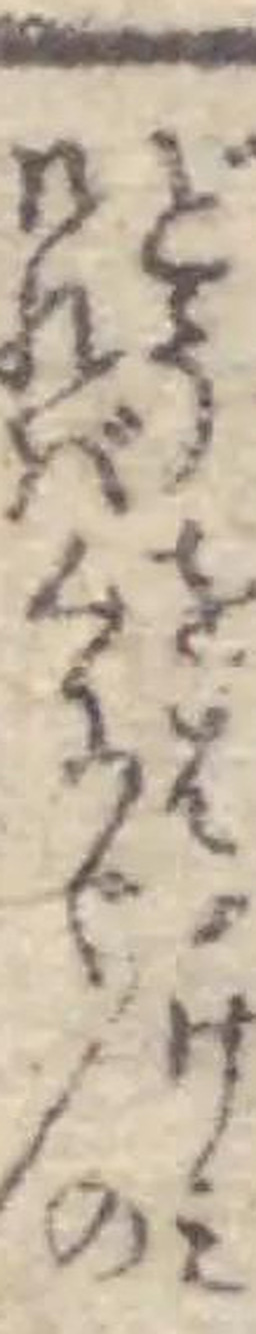ければくに〴〵の
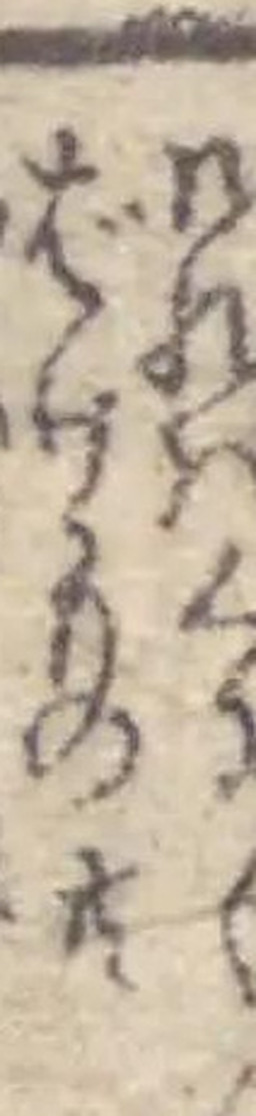ばけもの共
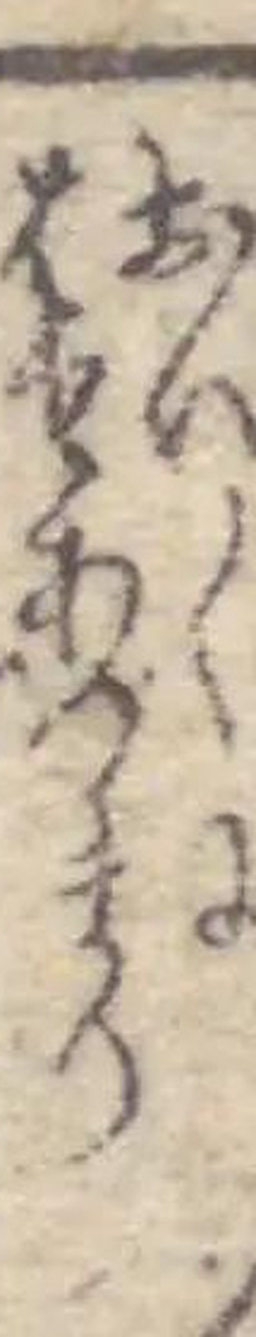はせあつまり
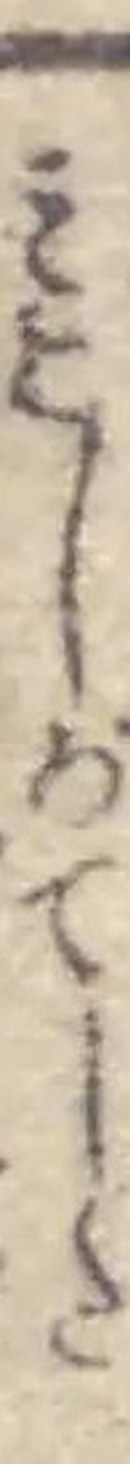みこしがてした
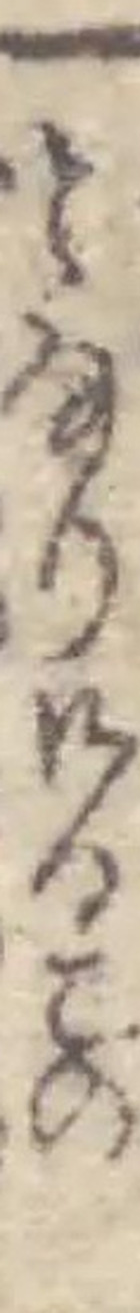となりけるこの
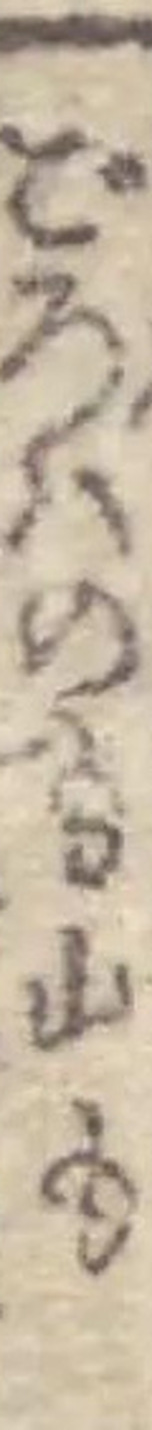ごろはのも山も
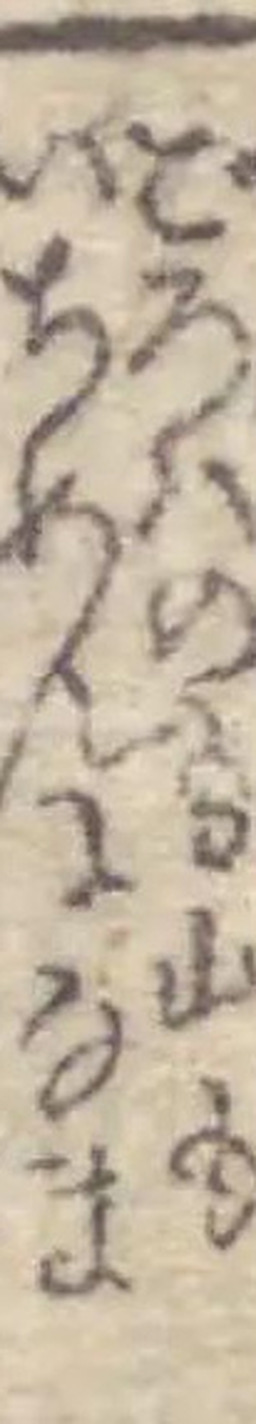いちめんになま
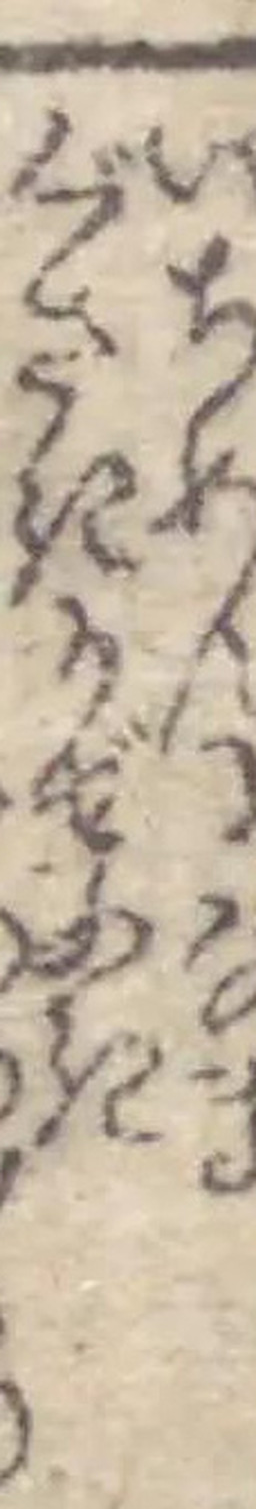ぐさきかぜふき
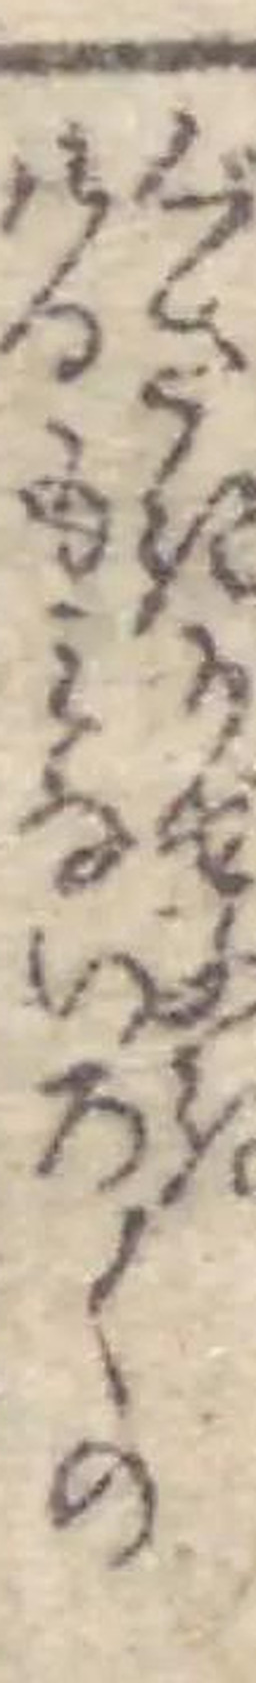けるもみないろ〳〵の
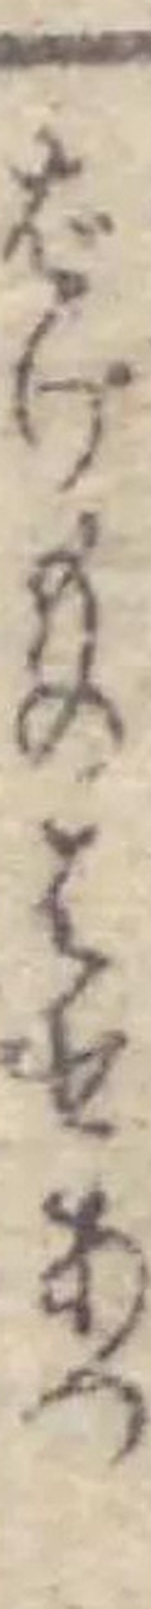ばけものはせあつ
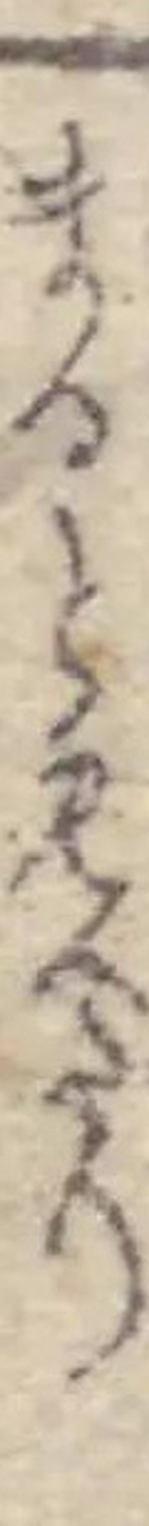まると見へたり
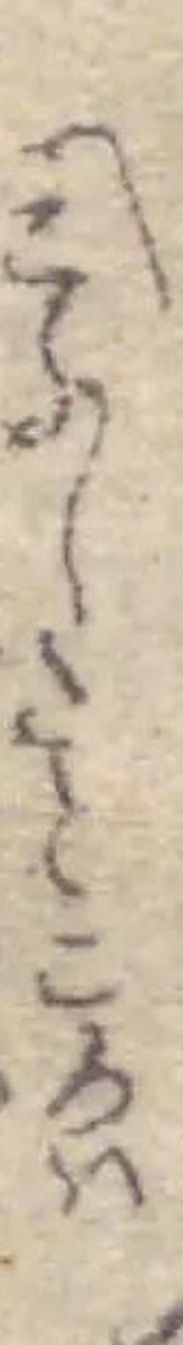〽こふしたところは
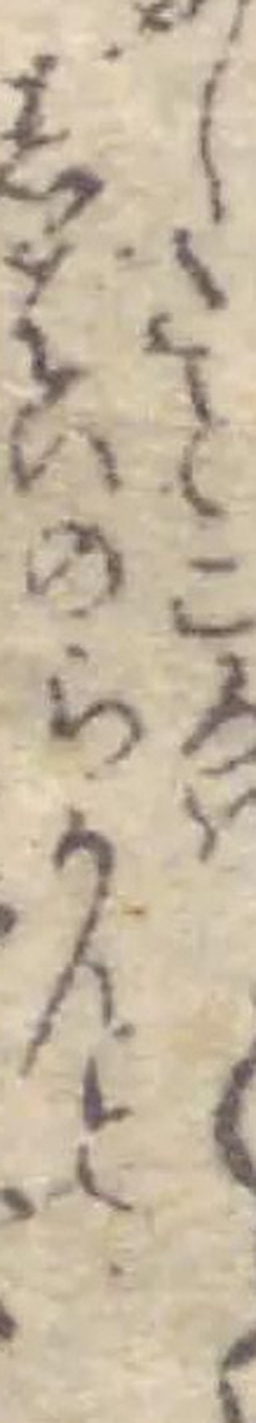しばいのらかんと
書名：化物尽 4巻
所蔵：国立国会図書館 National Diet Library, JAPAN
